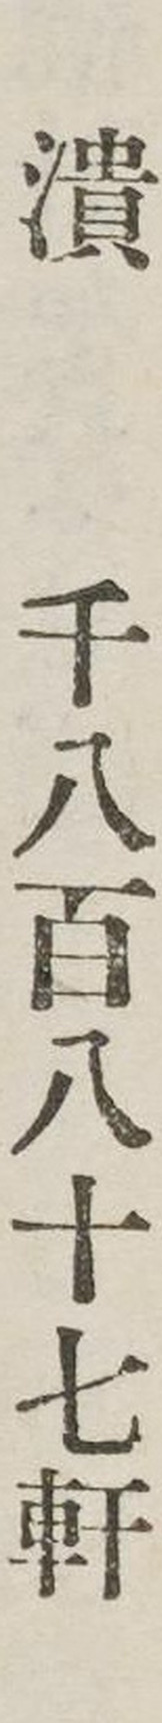潰千八百八十七軒
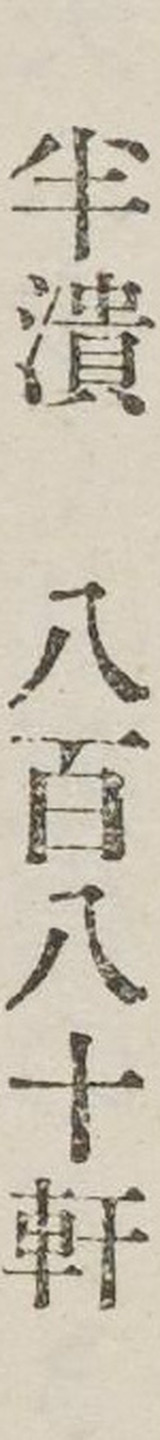半潰八百八十軒
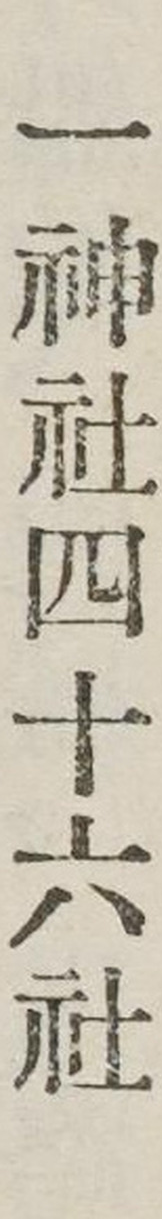一神社四十六社同
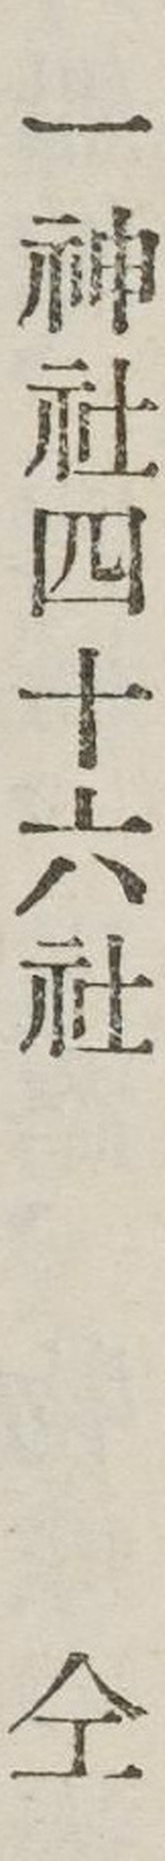一神社四十六社同
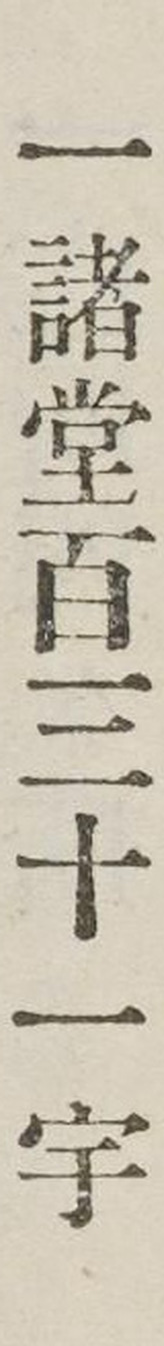一諸堂百三十一宇同
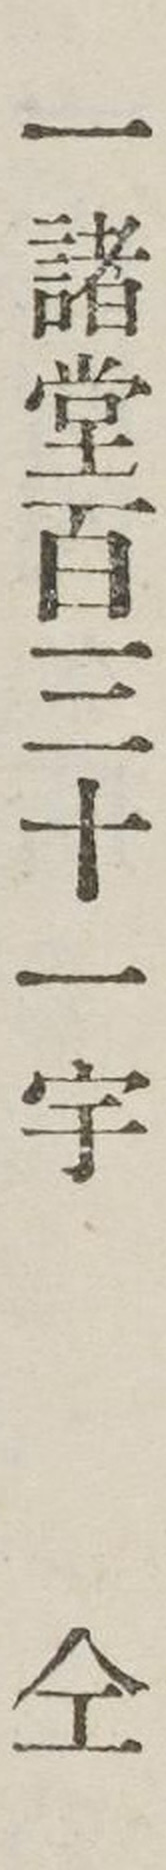一諸堂百三十一宇同
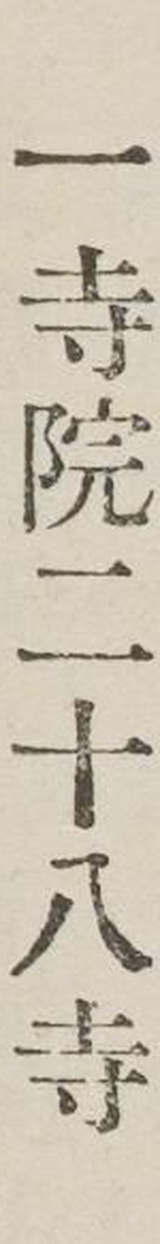一寺院二十八寺同
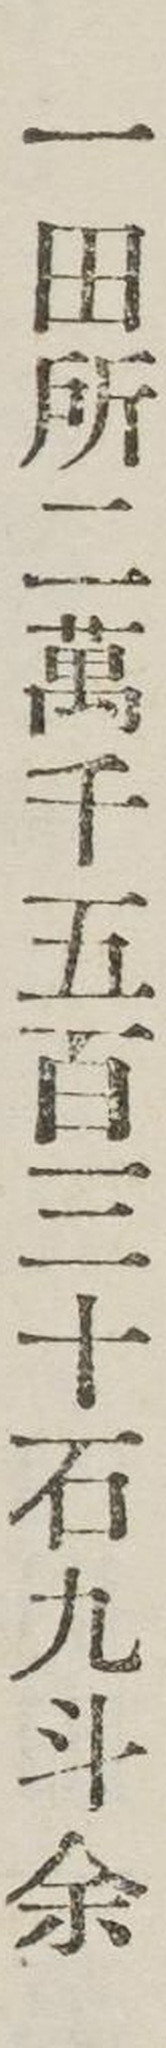一田所二万千五百三十石九斗余

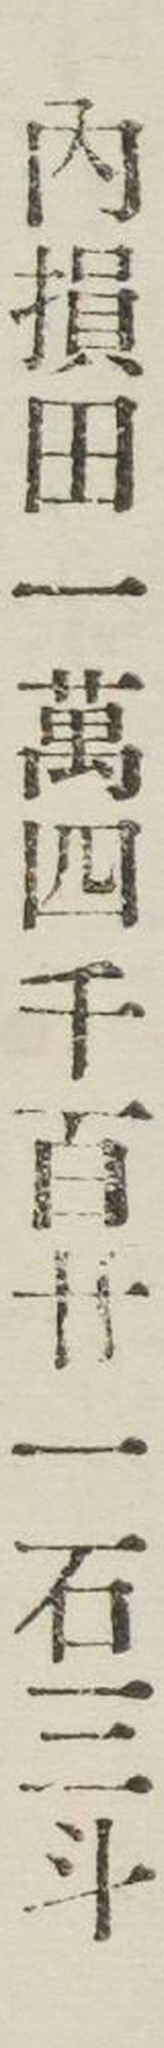内損田一万四千百廿一石三斗
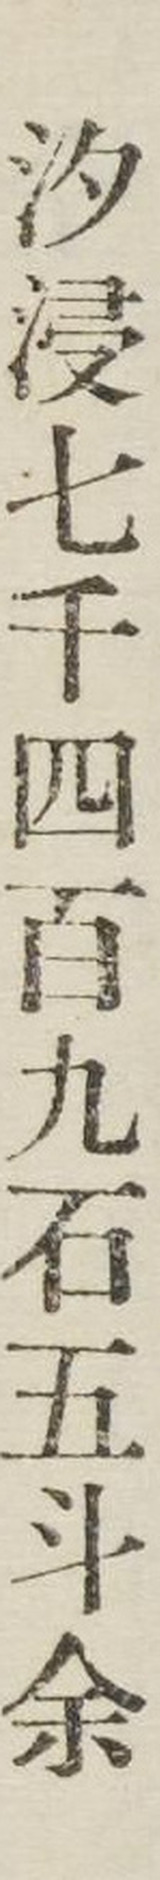汐浸七千四百九石五斗余
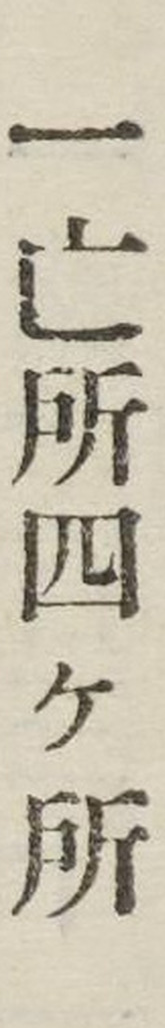一亡所四ヶ所
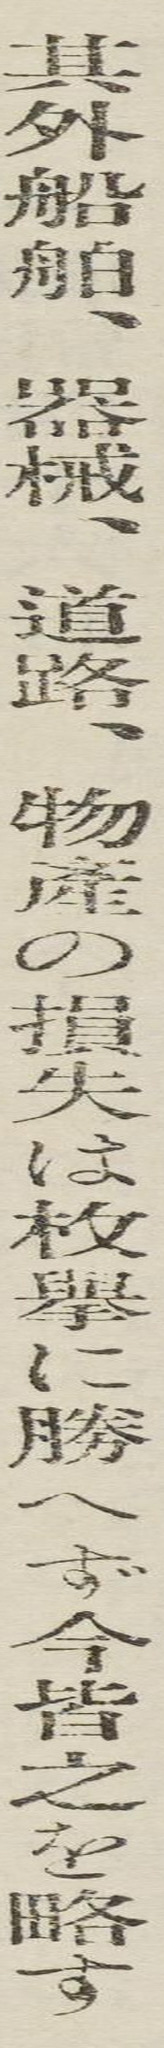其外船舶、器械、道路、物産の損失は枚挙に勝へず今皆之を略す
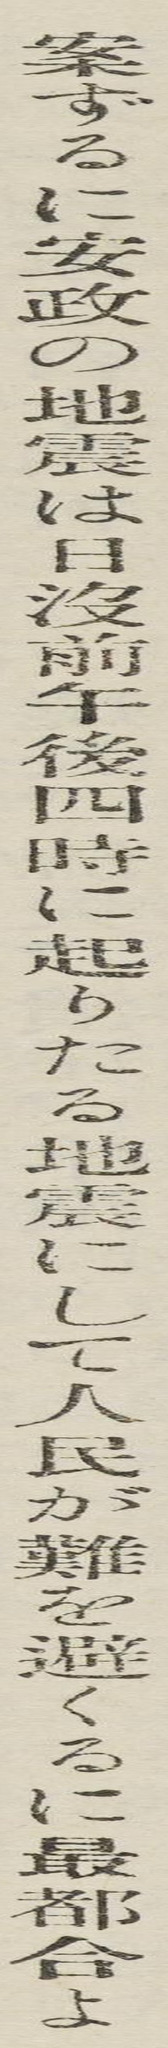案ずるに安政の地震は日没前午後四時に起りたる地震にして人民が難を避くるに最都合よ
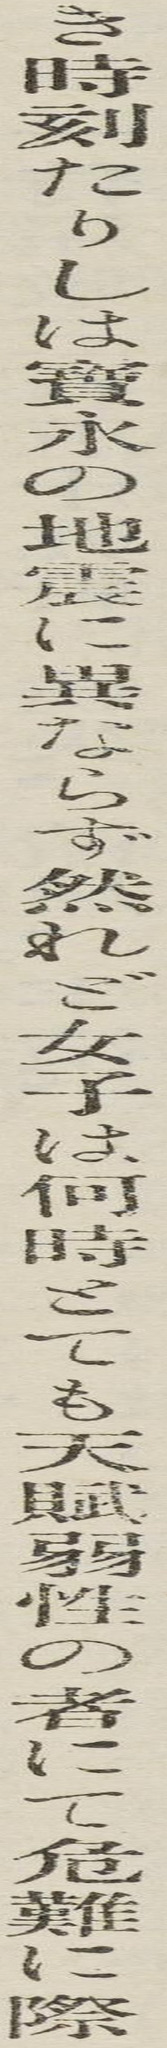き時刻たりしは宝永の地震に異なら然れども女子は何時とても天賦弱性の者にて危難に際
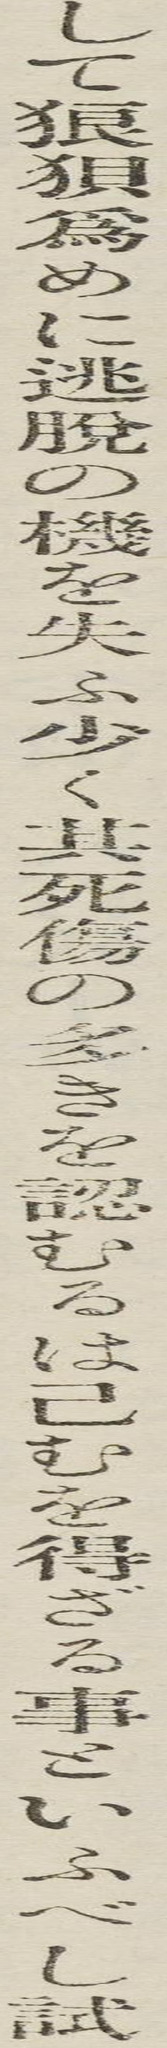して狼狽溜めに逃脱の機を失ふ少く其死傷の多きを認むるは己むを得ざる事といふべし試
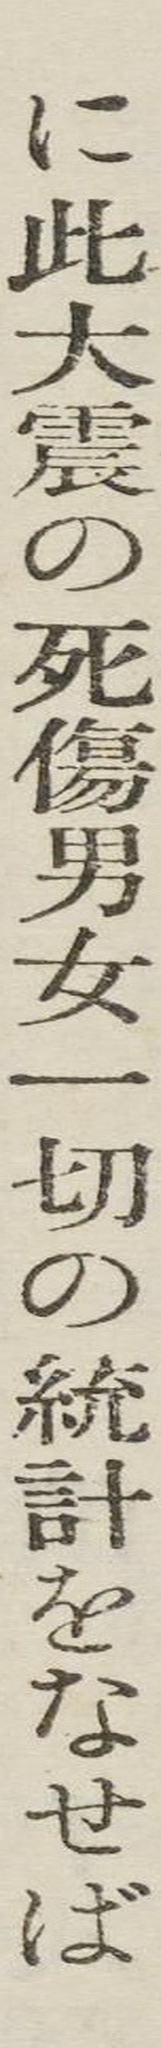に此大地震の死傷男女一切の統計をなせば
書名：土佐古今ノ地震
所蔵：東京大学地震研究所図書室 Earthquake Research Institute Library, The University of Tokyo, JAPAN
